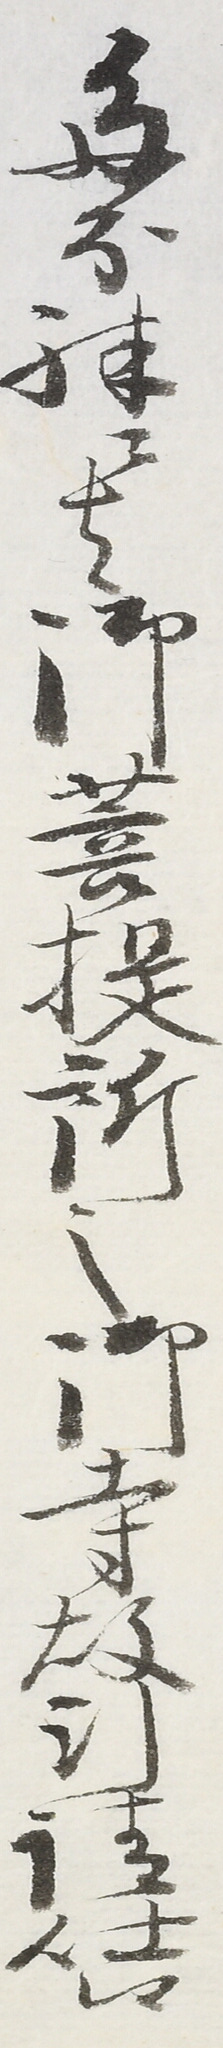多分殊ニ者御菩提所之御寺故引請仕候
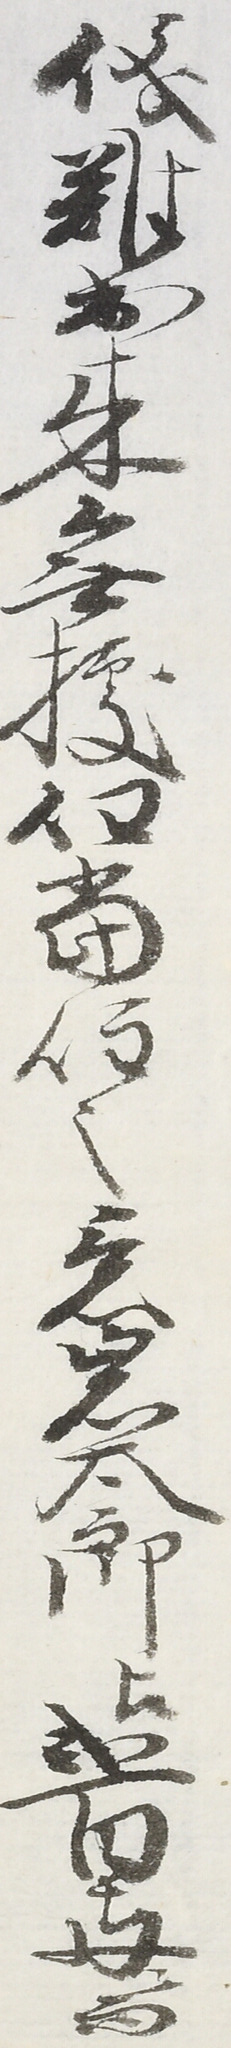儀難出来無拠任当任之倉岩太郎江弐百両ニ而
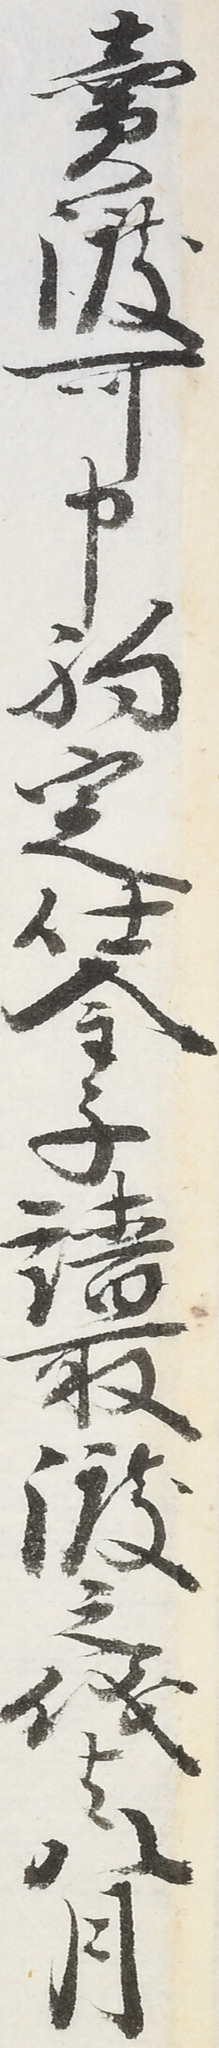売渡可申約定仕金子請取渡之儀与八月
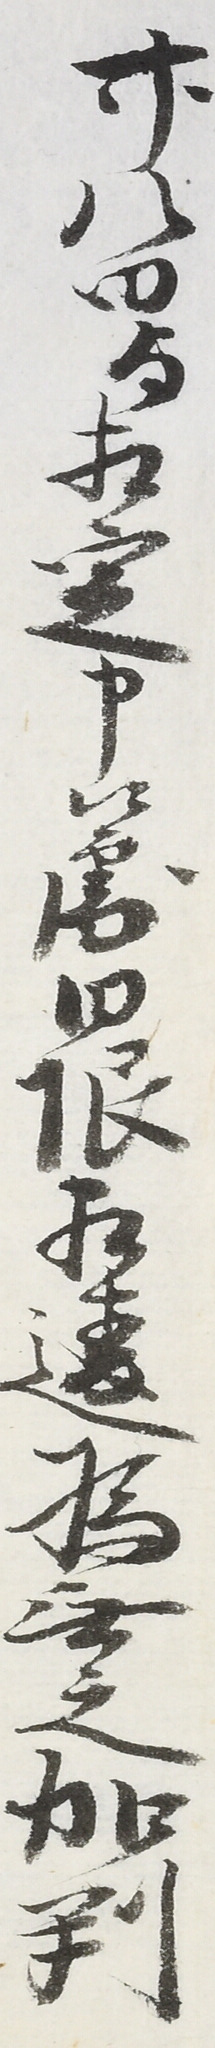廿八日与相定申候処日限相違為無之加判
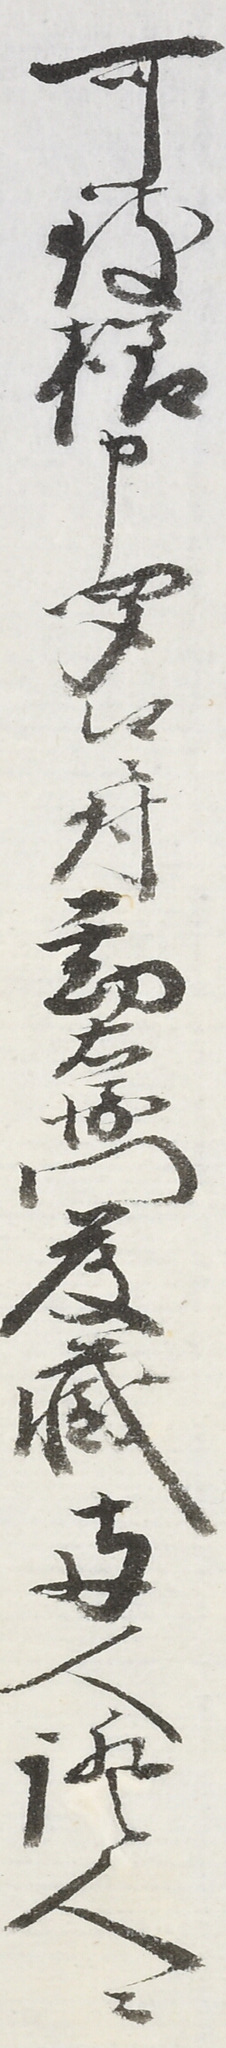可致様申聞候ニ付勘右衛門藤蔵両人証人ニ
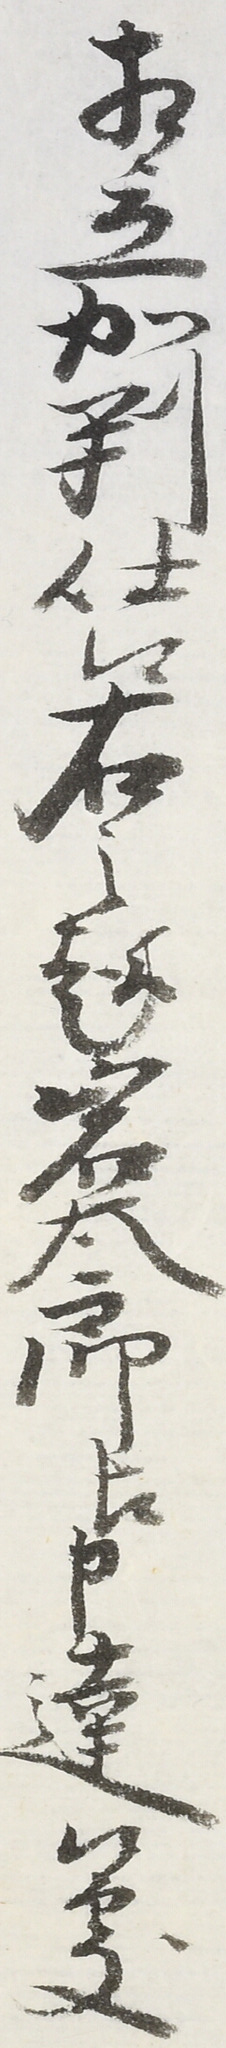相立加判仕候右之趣岩太郎江申達候処
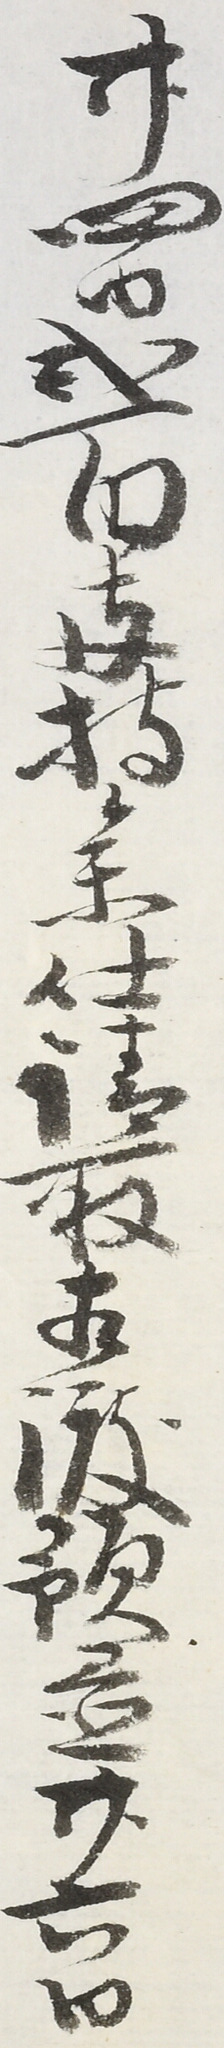廿四日弐百両持参仕請取相渡預置廿六日
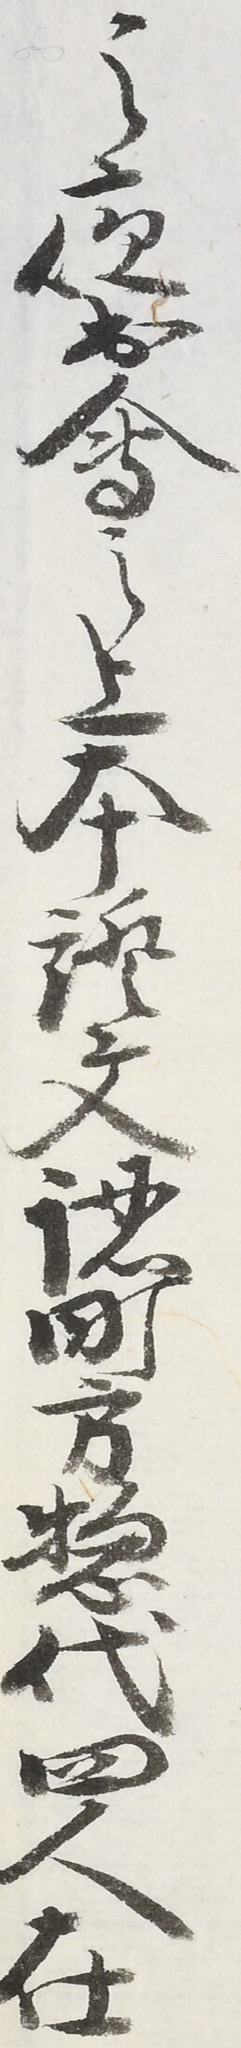之夜出会之上本証文認町方惣代四人在
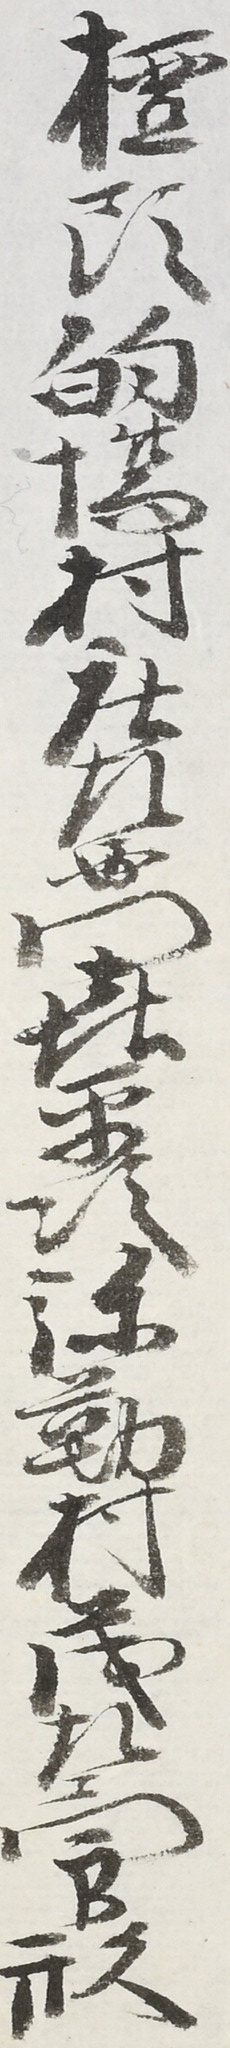檀頭的場村庄左衛門喜平次弥勒村茂左衛門印形
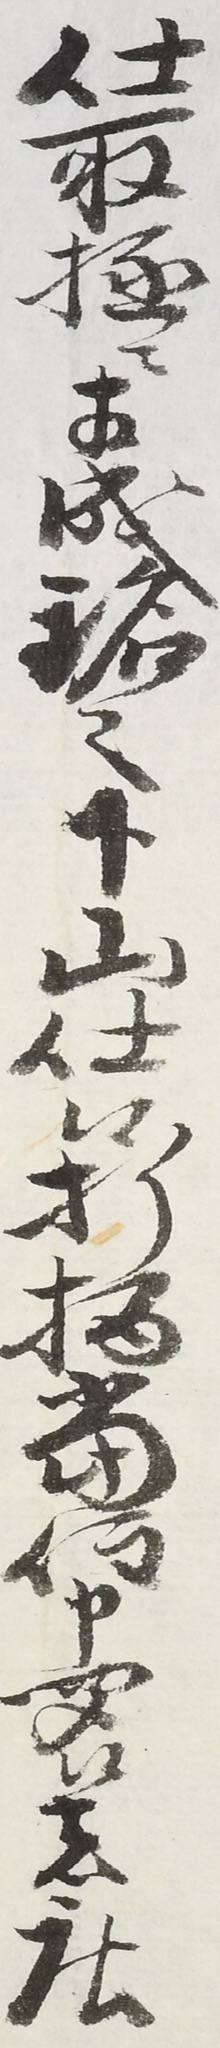仕取極ニ相成銘々下山仕候折柄当住申聞候者庄
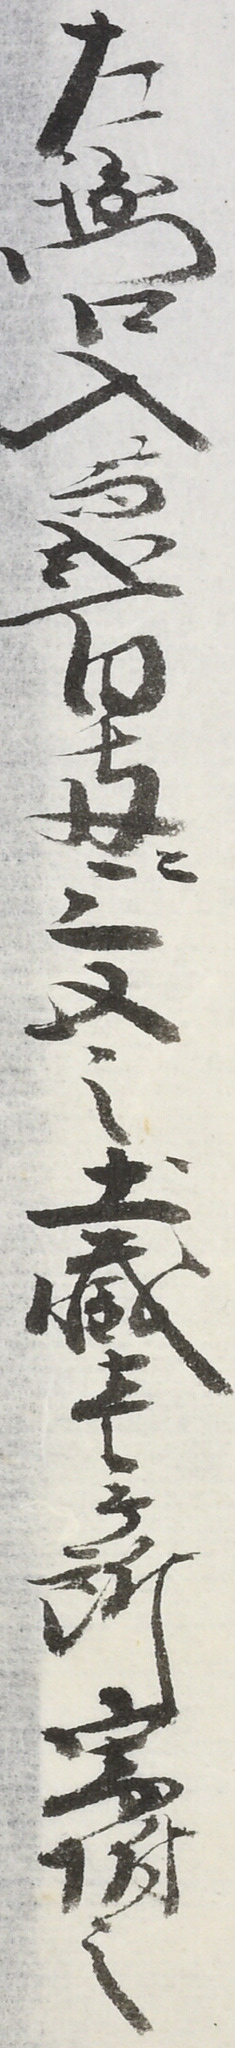左衛門口入ニ而弐百両ニ三五之土蔵壱ヶ所寄附之
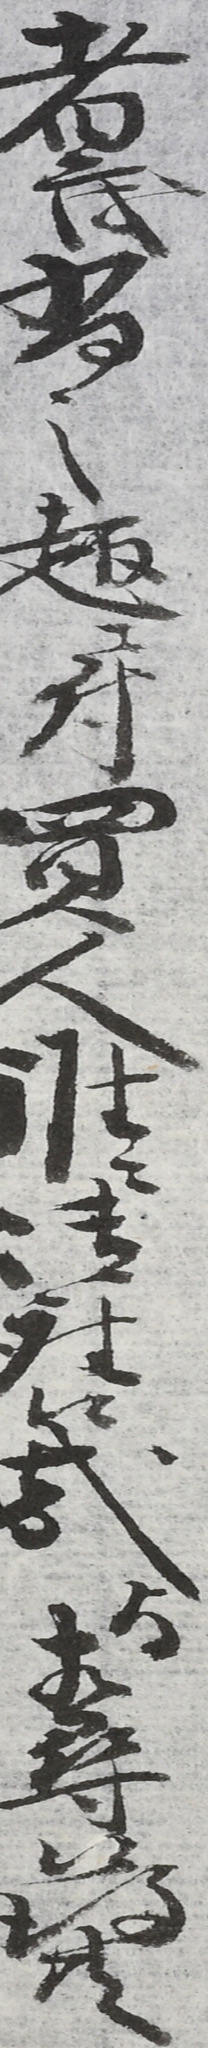者茂有之趣ニ付買入誰ニ御座候哉与相尋候得共

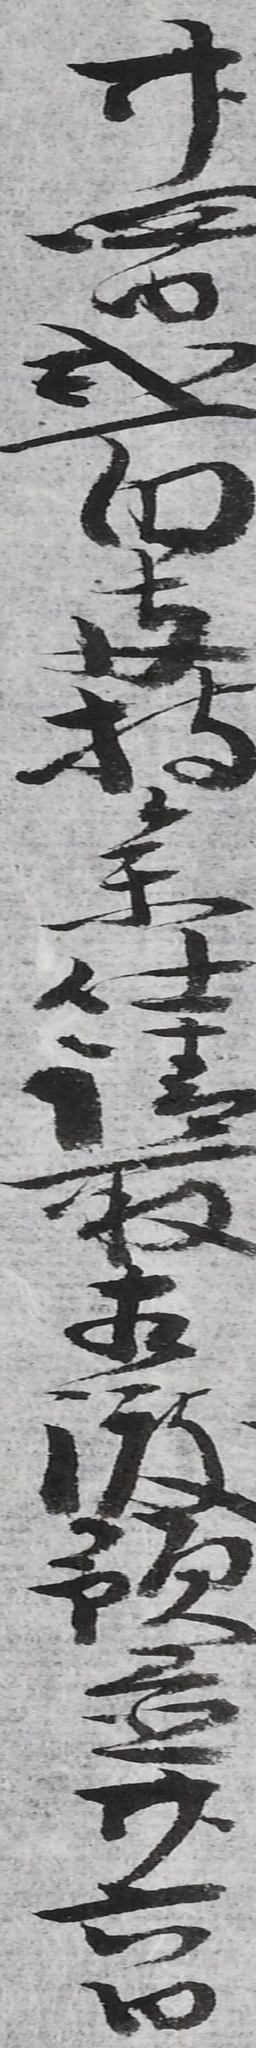廿四日弐百両持参仕請取相渡預置廿六日
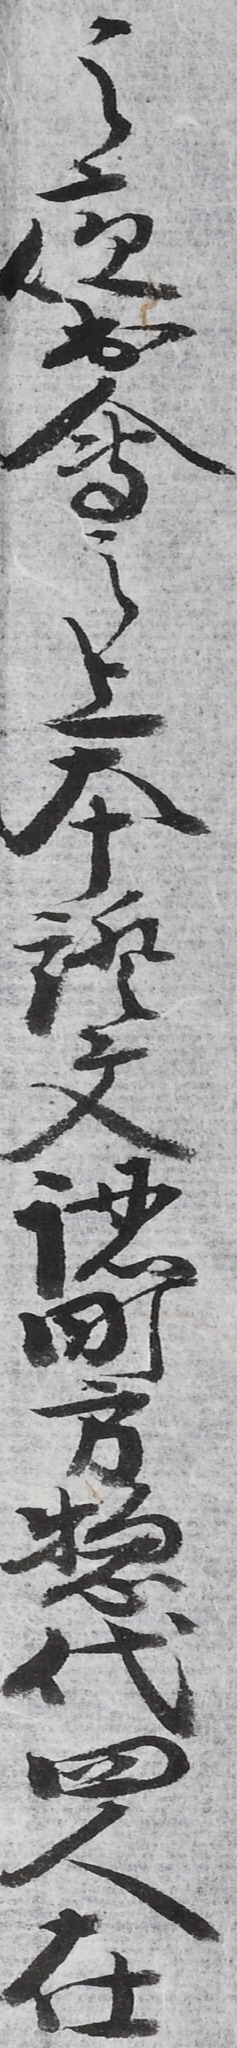之夜出会之上本証文認町方惣代四人在
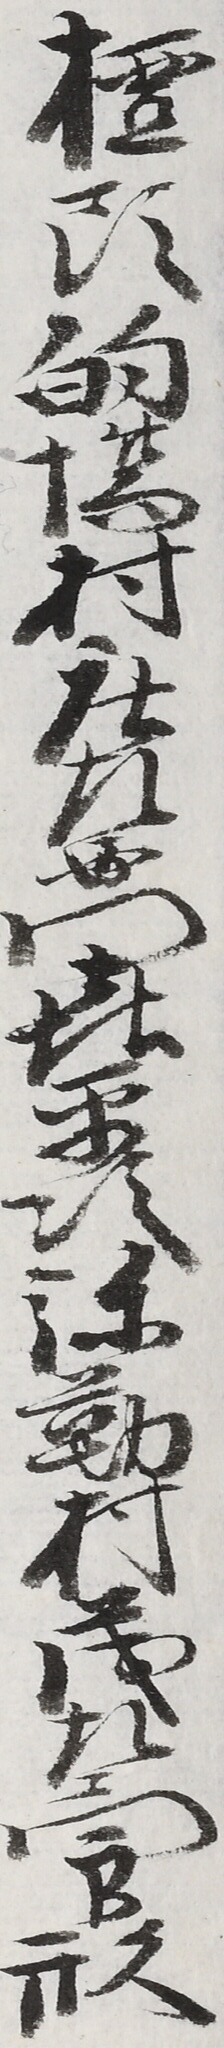檀頭的場村庄左衛門喜平次弥勒村茂左衛門印形
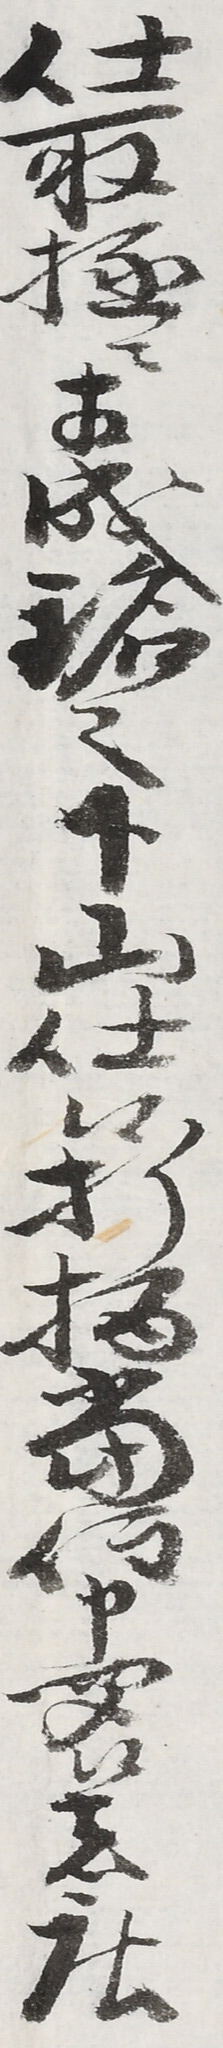仕取極ニ相成銘々下山仕候折柄当住申聞候者庄
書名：乍恐以口上書奉願上候御事
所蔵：伊那市立高遠町図書館・合同会社AMANE
